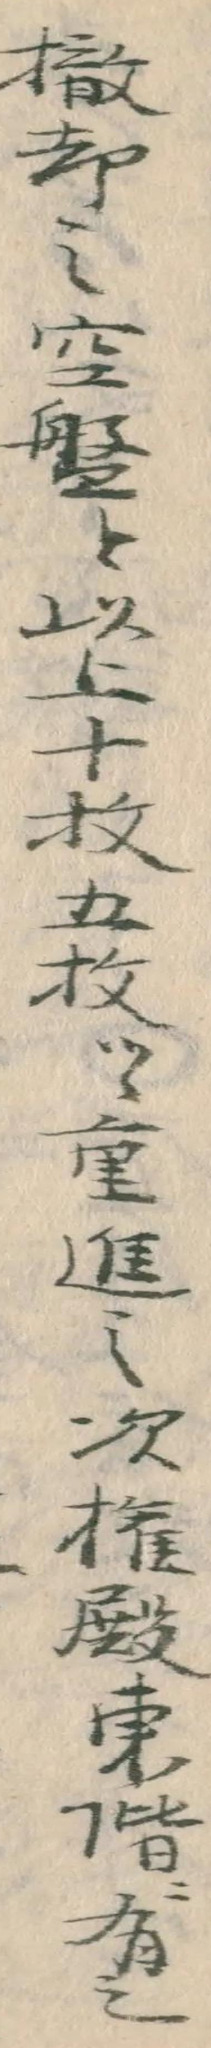撤却之空盤と以上十枚五枚ツゝ重進之次権殿東階ニ有之
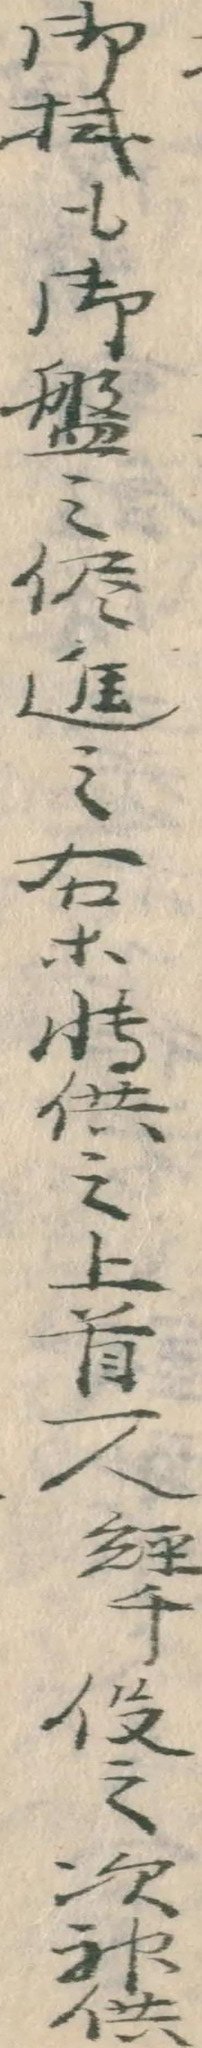御拭も御盤之侭進之右等転供上首一人経千役之次神供
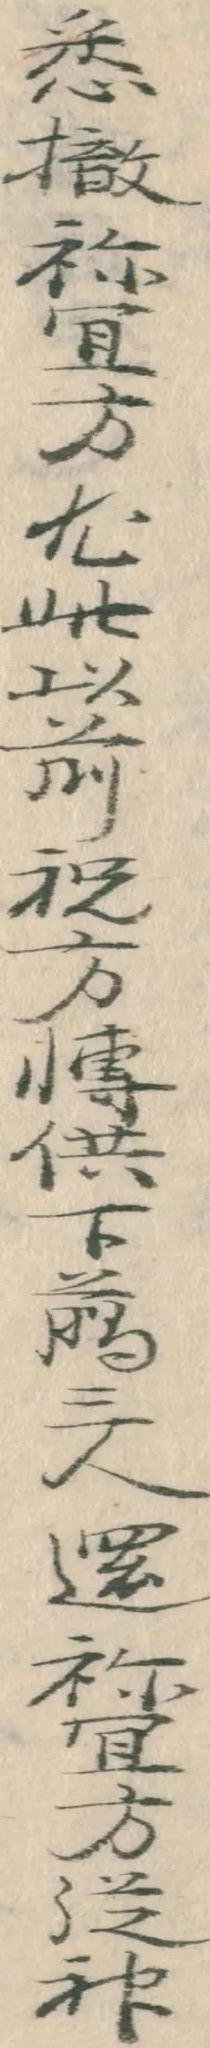悉撤祢宜方尤此以前祝方転供下臈三人還祢宜方従神
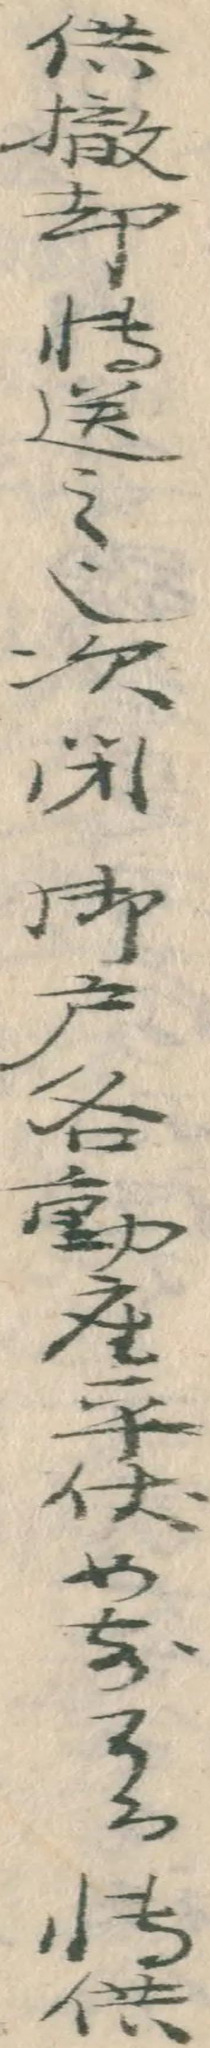供撤却転送之也次閉御戸各動座平伏如前了而転供
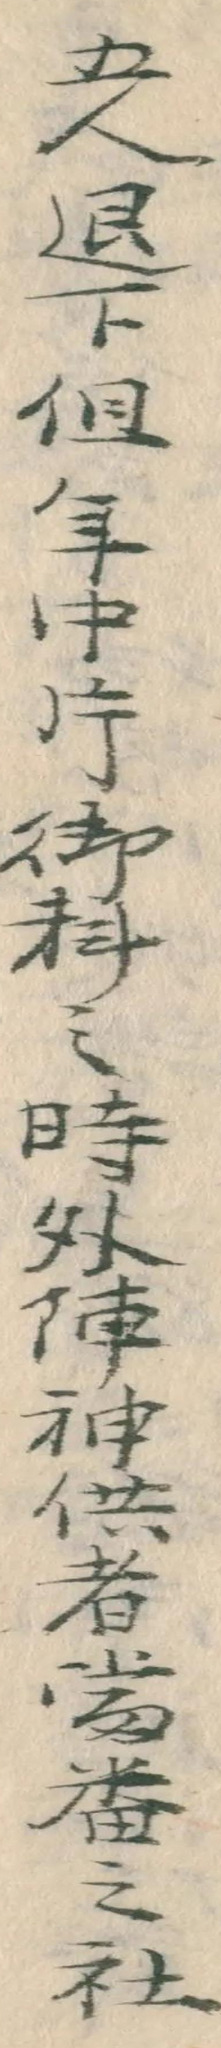五人退下但年中片御料之時外陣神供者当番之社
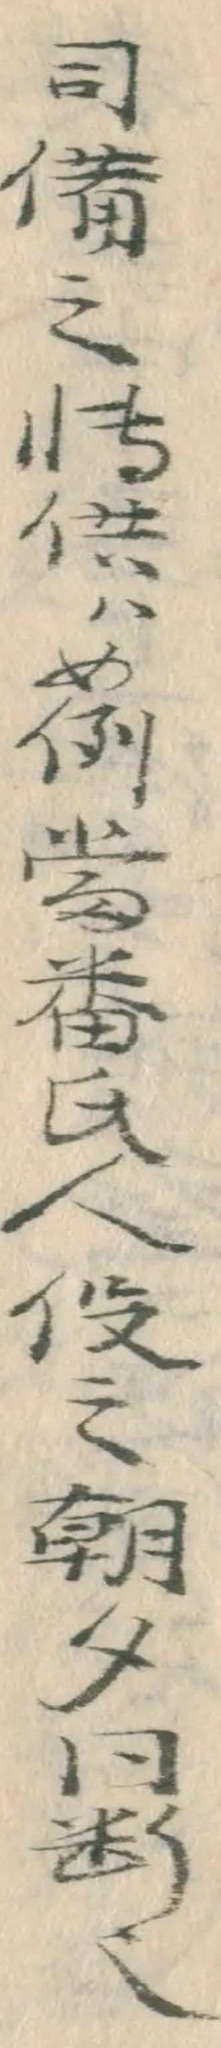司備之転供ハ如例当番氏人役之朝夕同断也
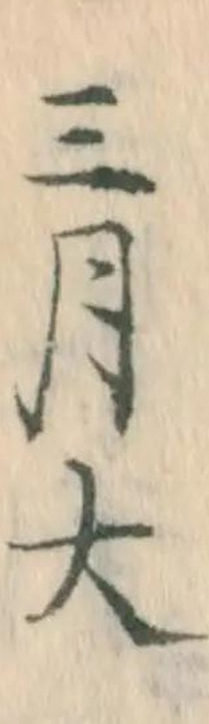三月大
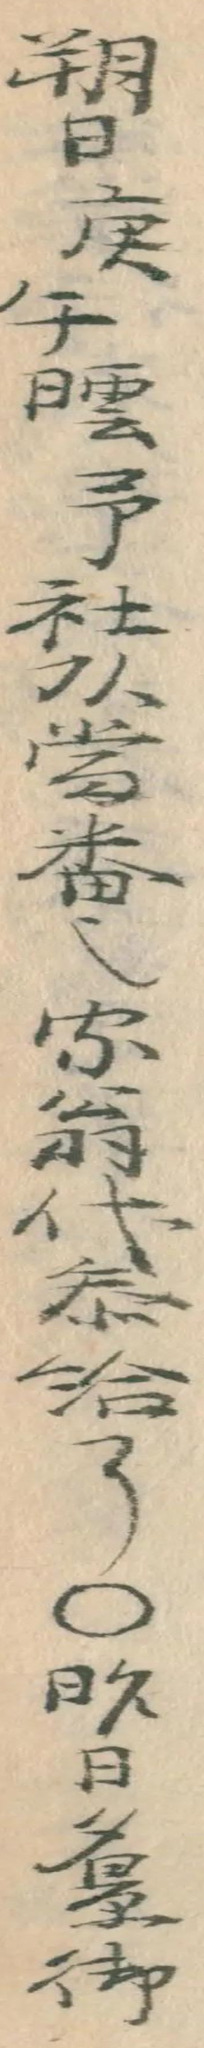朔日庚午曇予社頭当番也家翁代参給了○昨日夕景御

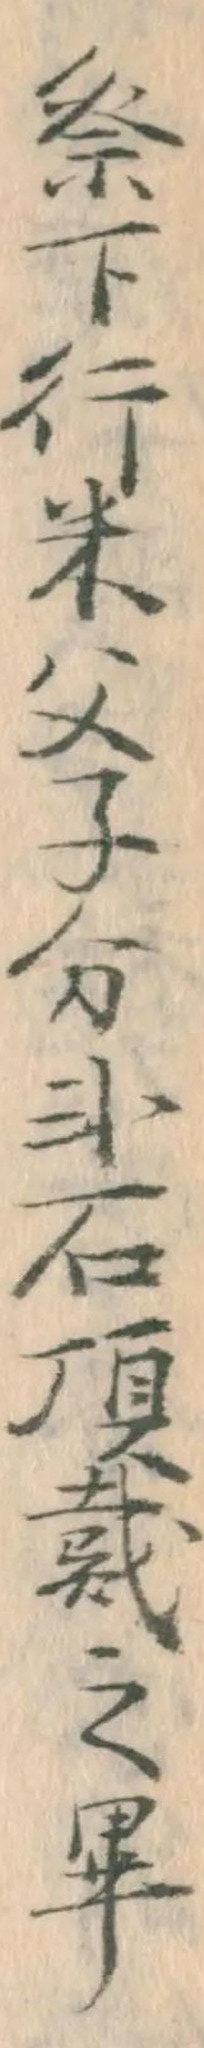祭下行米父子分弐石頂戴之畢
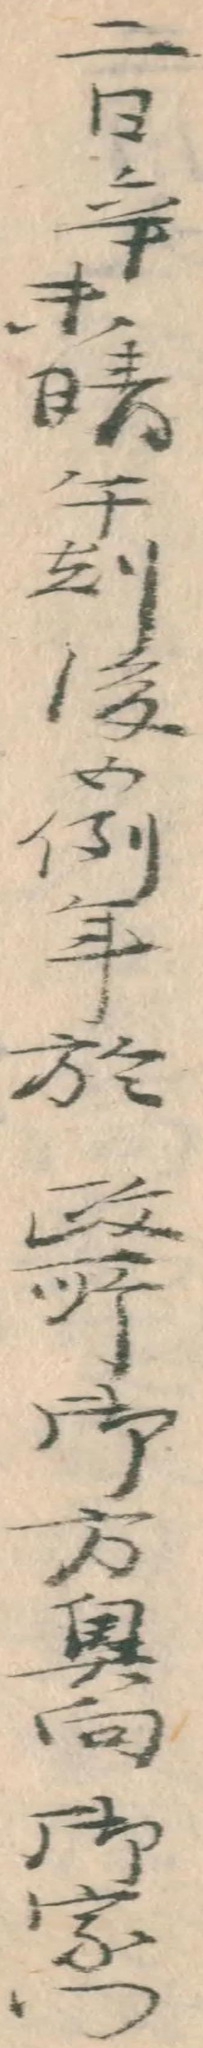二日辛未晴午刻後如例年於政所御方奥向御家門
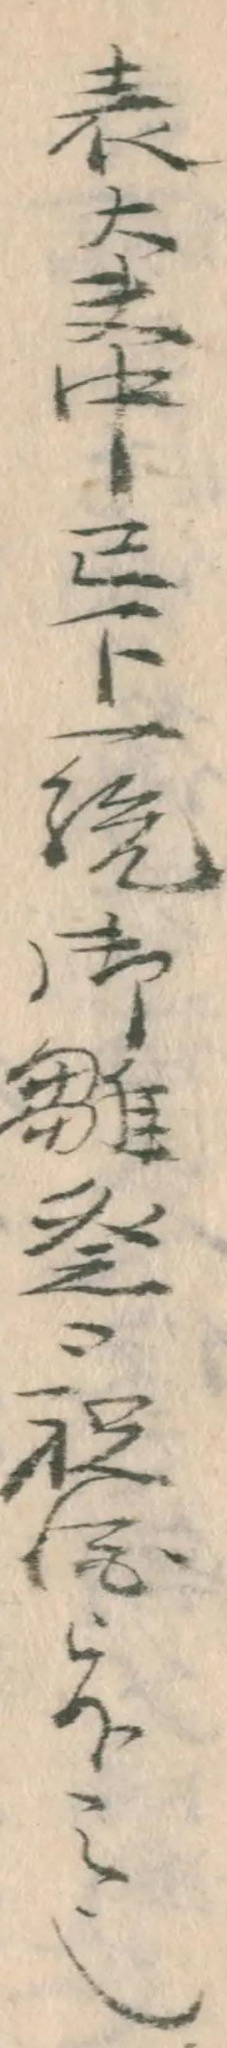表大夫中已下一統御雛祭御祝酒被下之也
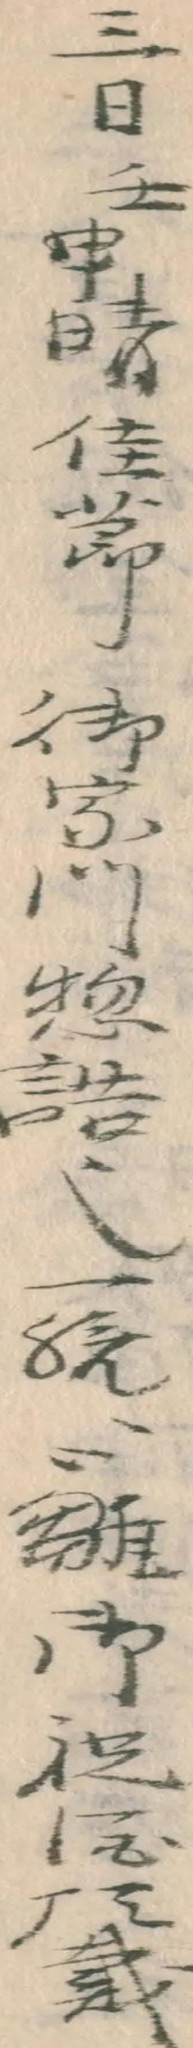三日壬申晴佳節御家門惣詰也一統へ御雛御祝酒頂戴
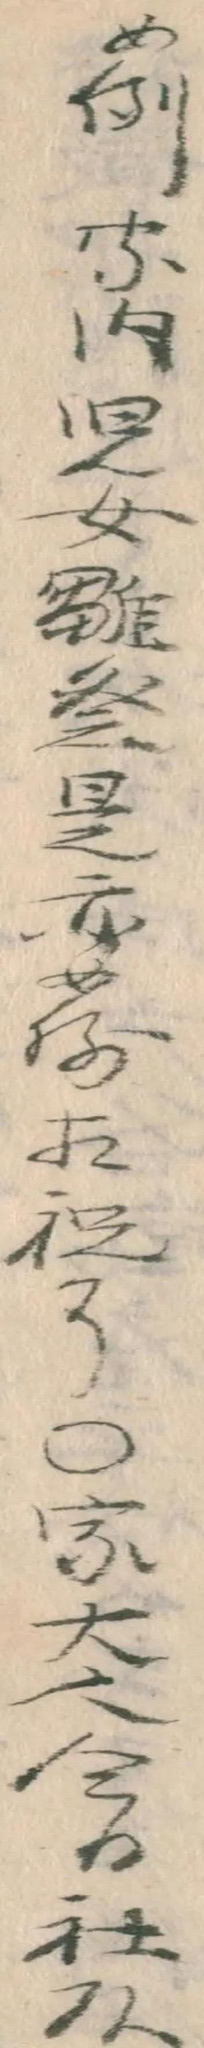如例家内児女雛祭是亦如例相祝了〇家大人今日社頭
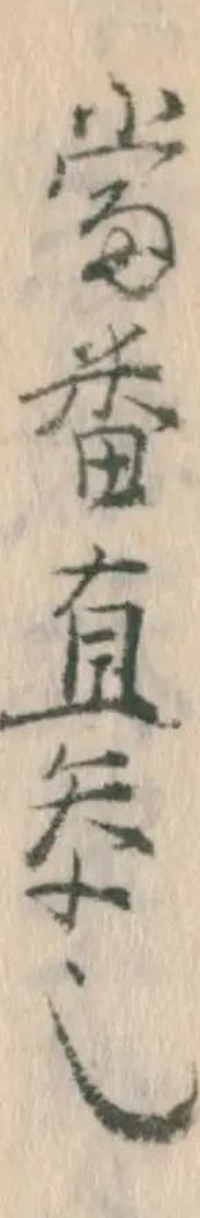当番直参也
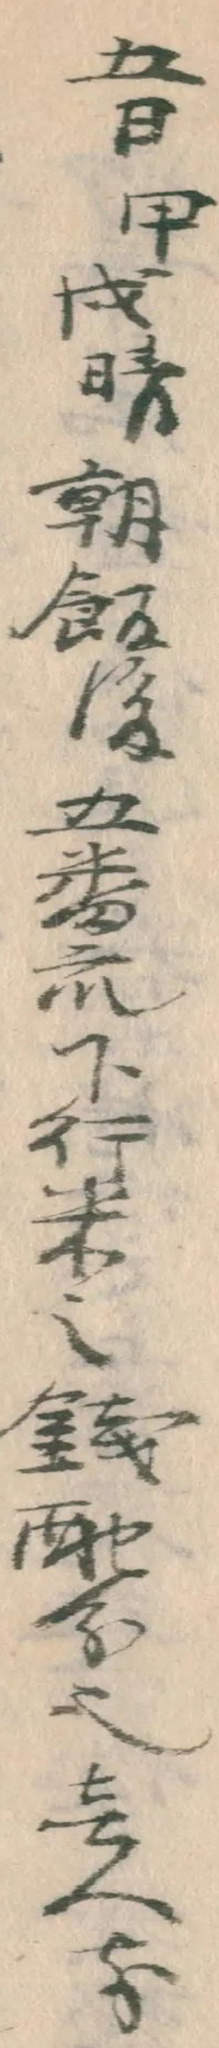五日甲戌晴朝飯後五番衆下行米之銭配分也壱人前
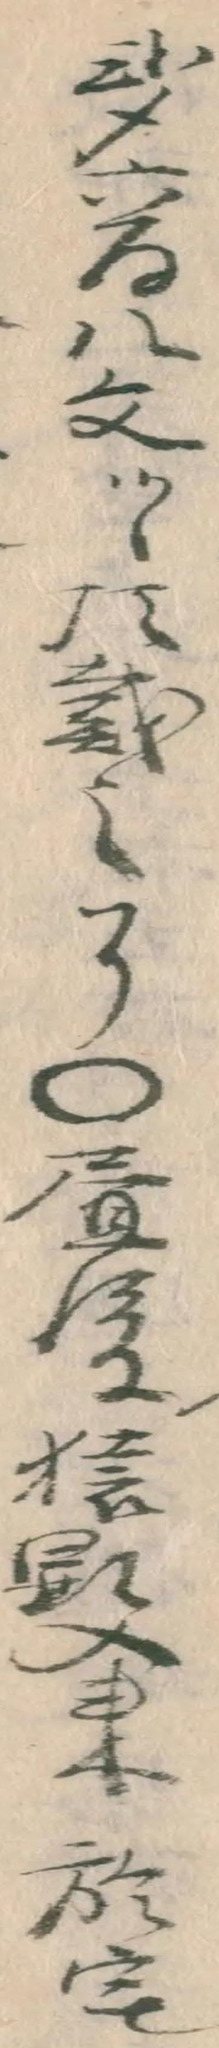弐貫六百八文ツゝ頂戴之了〇昼後猿顕入来於宅
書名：賀茂社記録. 第64冊
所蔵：国立国会図書館 National Diet Library, JAPAN
